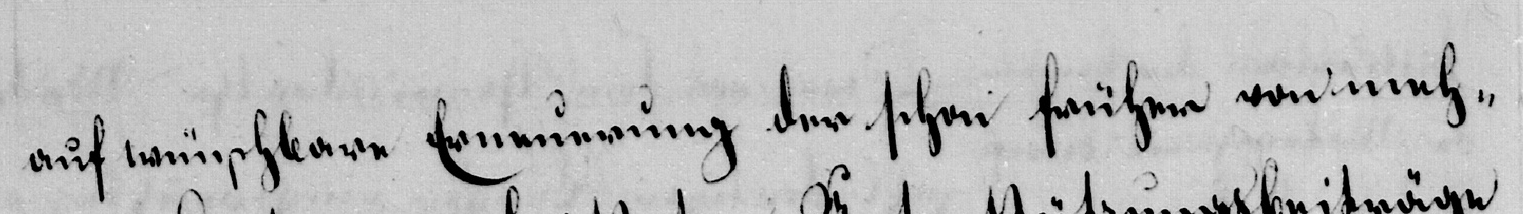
auf wünschbare Erneuerung der schon früher von meh¬
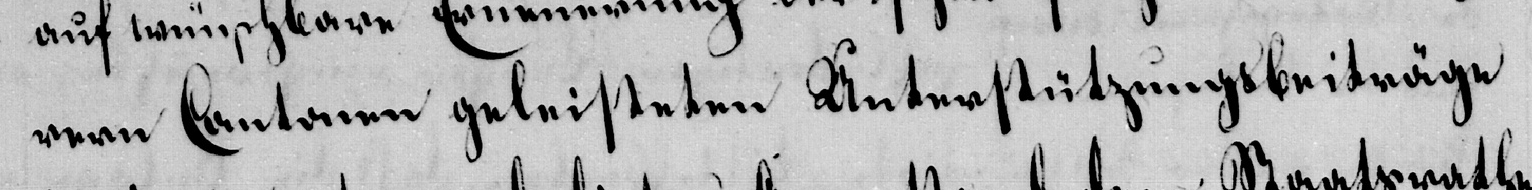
rern Cantonen geleisteten Unterstützungsbeiträge
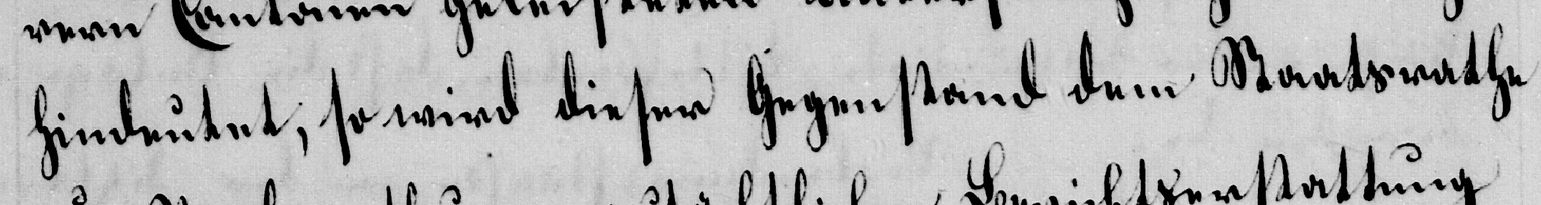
hindeutet, so wird dieser Gegenstand dem Staatsrathe
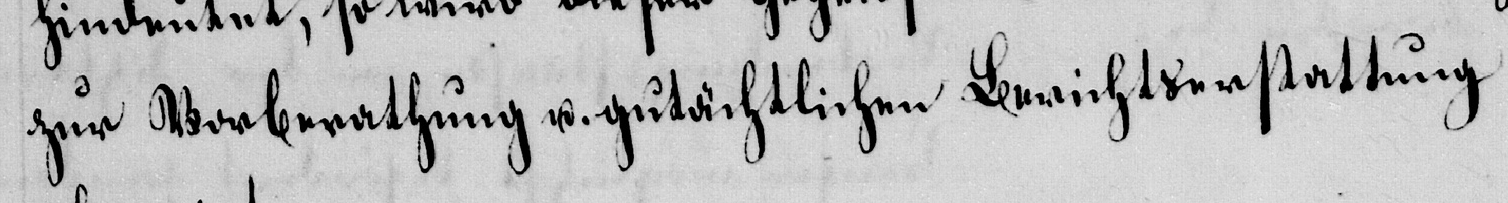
zur Vorberathung u. gutächtlichen Berichtserstattung
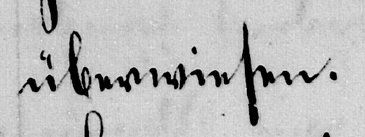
überwiesen.
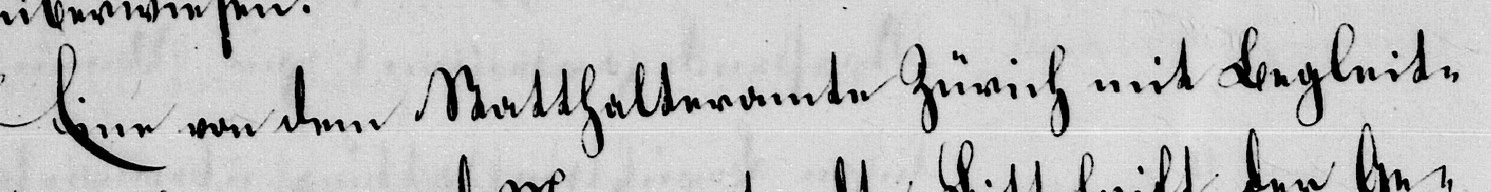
Ein von dem Statthalteramte Zürich mit Begleit¬
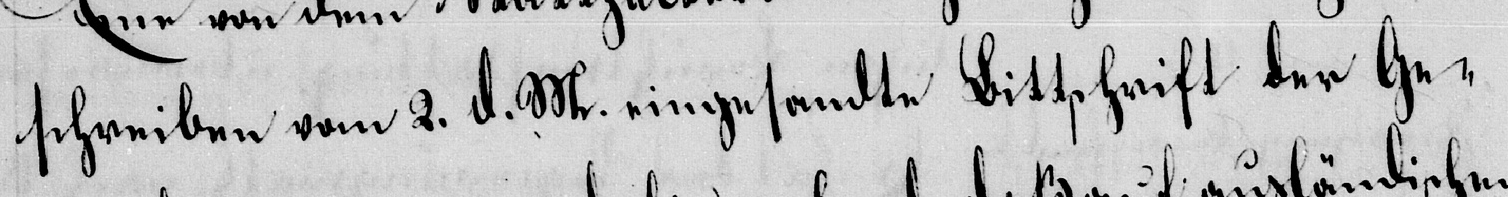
schreiben vom 2. d. M. eingesandte Bittschrift der Ge¬
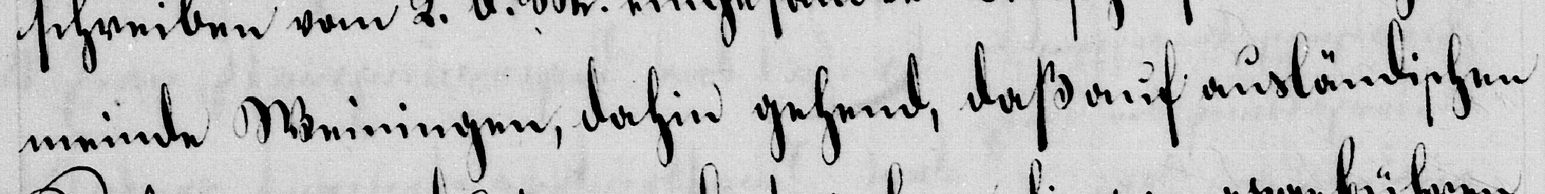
meinde Weiningen, dahin gehend, daß auf ausländischen
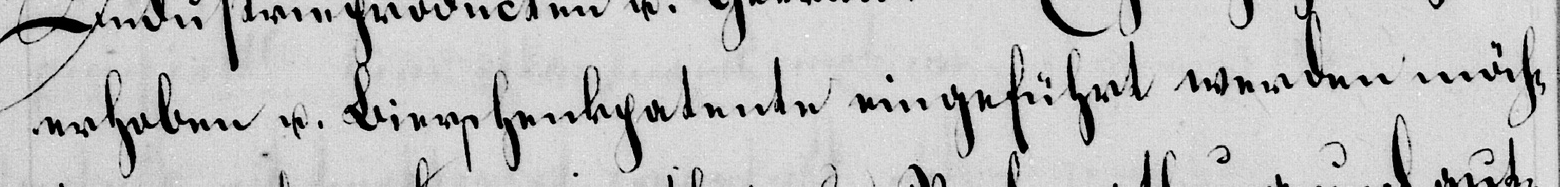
erhoben u. Bierschenkpatente eingeführt werden möch¬
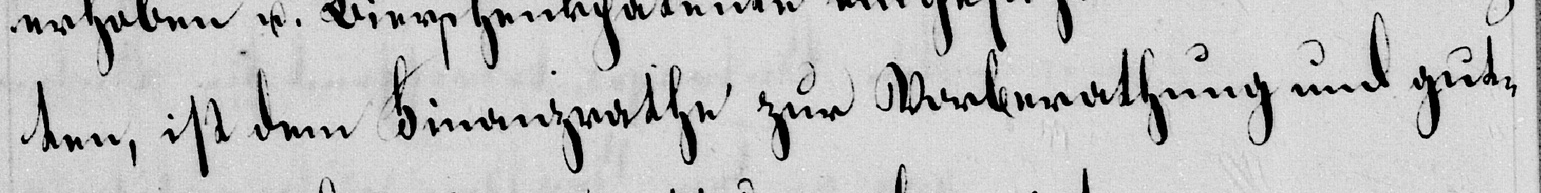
ten, ist dem Finanzrathe zur Vorberathung und gut¬
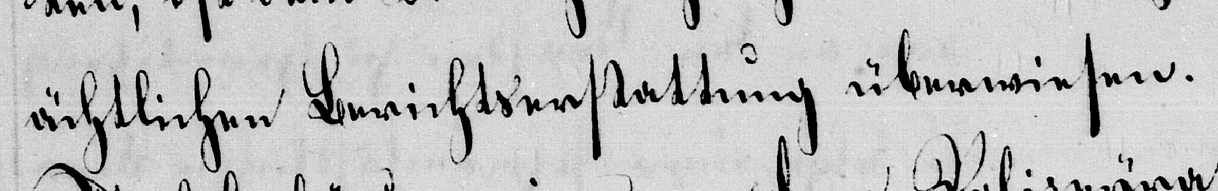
ächtlicher Berichtserstattung überwiesen.
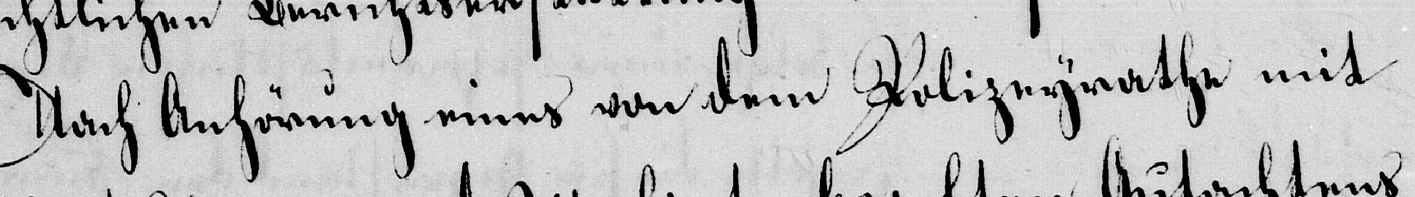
Nach Anhörung eines von dem Polizeyrathe mit
